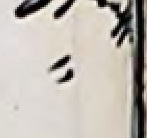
„
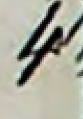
4
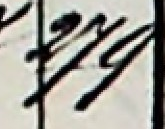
279
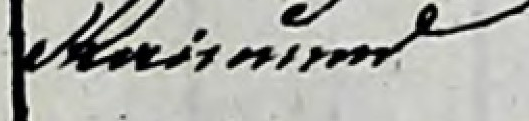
Maria und
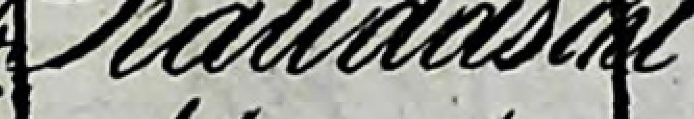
Raudaschl
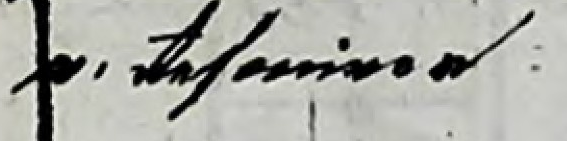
v. Res???
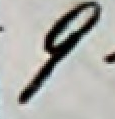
9
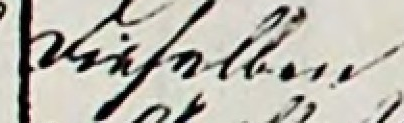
Dieselben
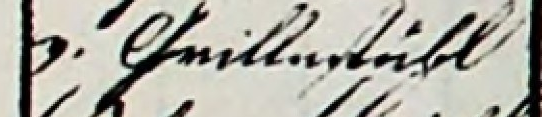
v. Grittestäbl
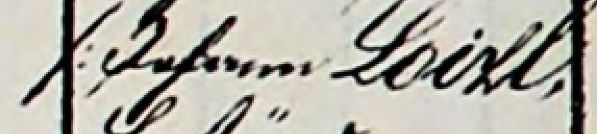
/Johann Loizl,
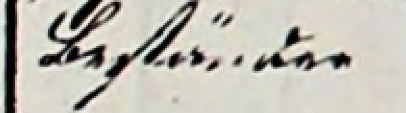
Beständen
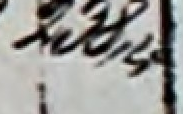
238,4
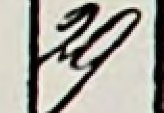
29
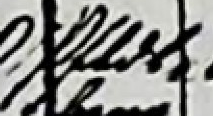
Pflds„
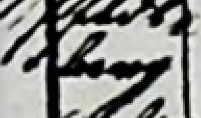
berg
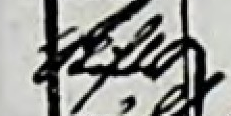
Stifts
